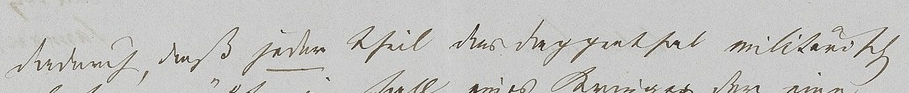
dadurch, daß jeder Theil das Dappenthal militärisch
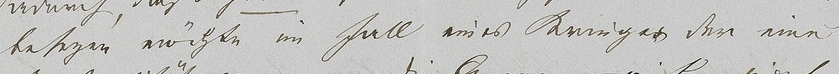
besezen möchte im Fall eines Krieges der eine
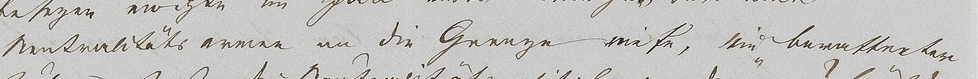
Neutralitätsarmee an die Grenze riefe, ein bewaffneter
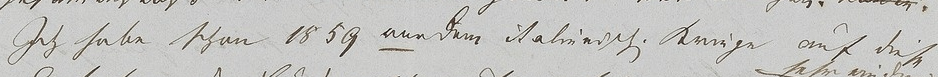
Ich habe schon 1859 vor dem italienisch. Kriege auf diese
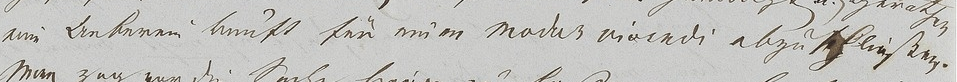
eine Uebereinkunft für einen modus vivendi abzuschließen.
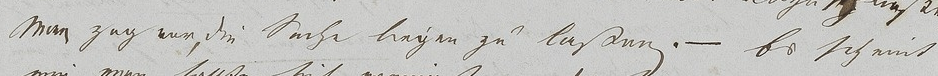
Man zog vor, die Sache liegen zu laßen. – Es scheint
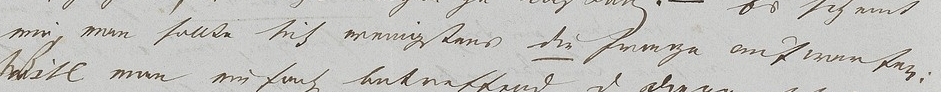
mir, man sollte sich wenigstens die Frage aufwerfen:
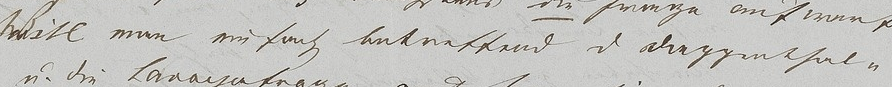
Will man einfach betreffend d Dappenthal-
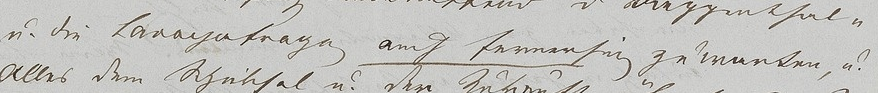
u. die Savoyer frage auch fernerhin zuwarten, u.
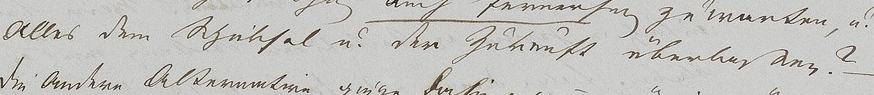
Alles dem Schicksal u. der Zukunft überlaßen? –
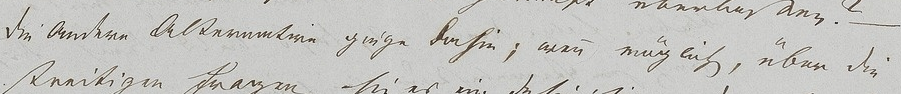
Die andere Alternative ginge dahin; wenn möglich, über die
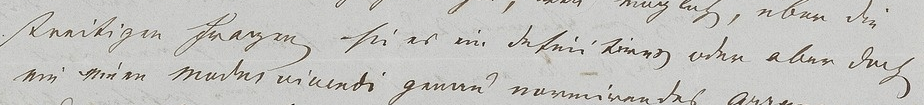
streitigen Fragen, sei es ein definitives oder aber doch
